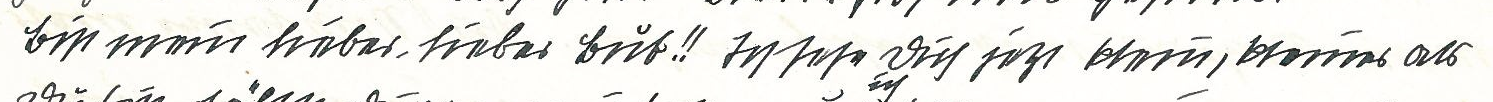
Bist mein lieber, lieber Bub!! Ich sehe Dich jetzt klein, kleiner als
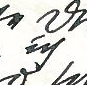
ich
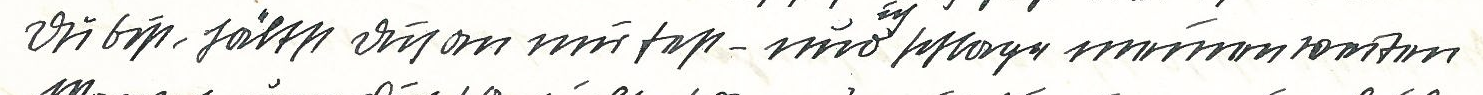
Du bist, hältst Dich an mir fest – und schlage meinen weiten
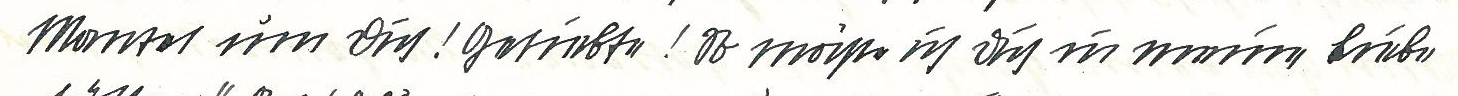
Mantel um Dich! Geliebte! So möchte ich Dich in meine Liebe
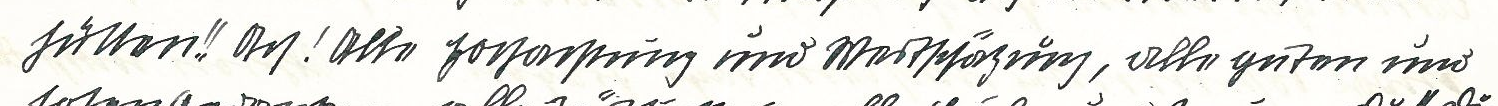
hüllen!! Ach! Alle Hochachtung und Wertschätzung, alle guten und
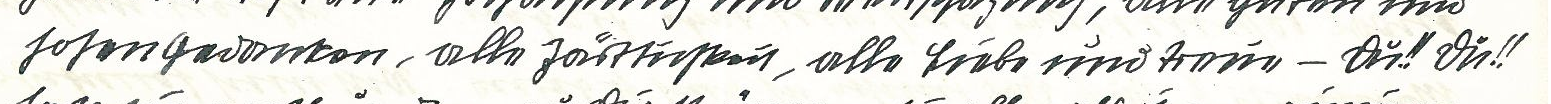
hohen Gedanken, alle Zärtlichkeit, alle Liebe und Treue – Du!! Du!!
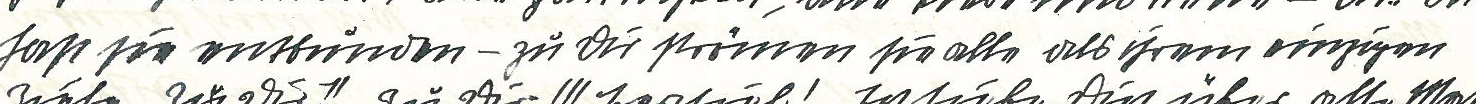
ast sie entbunden – zu Dir strömen sie alle als ihrem einzigen
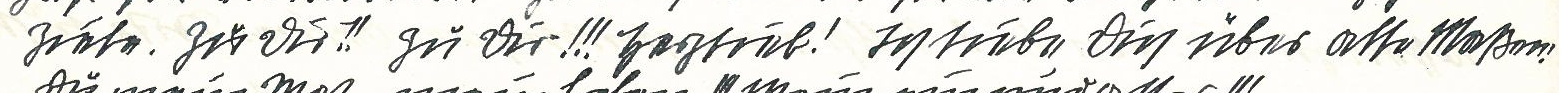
Ziele. Zu Dir!! Zu Dir!!! Herzlieb! Ich liebe Dich über alle Maßen.
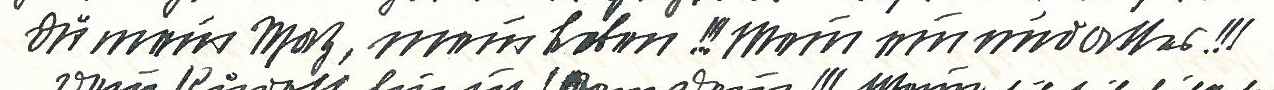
Du mein Schatz, mein Leben!!! Mein ein und alles!!!
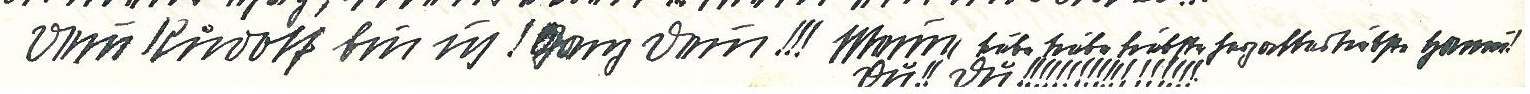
Dein bin ich! Ganz Dein!!! Meine liebe, liebe, liebste herzallerliebste !
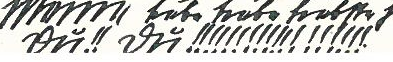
Du!! Du!!!!!!!!!!!!!!!!!!
